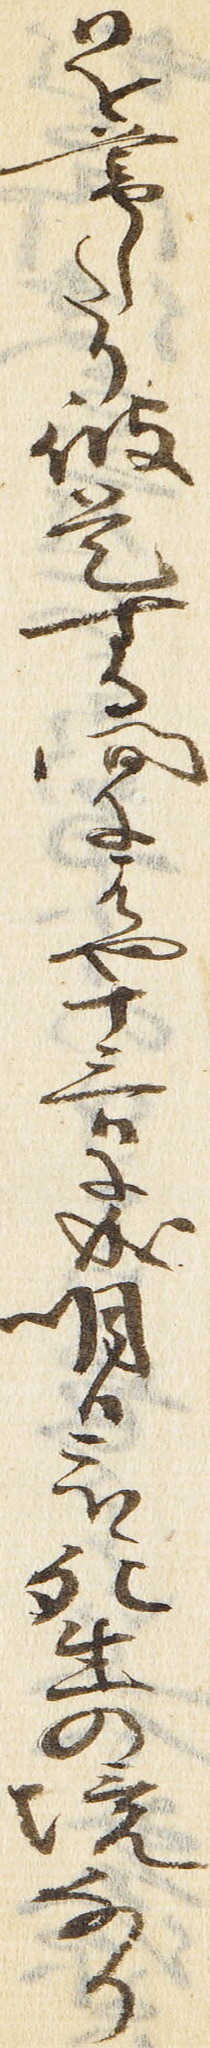日を暮したり彼是する間にはや十三日に成明日こそ死生の境なり
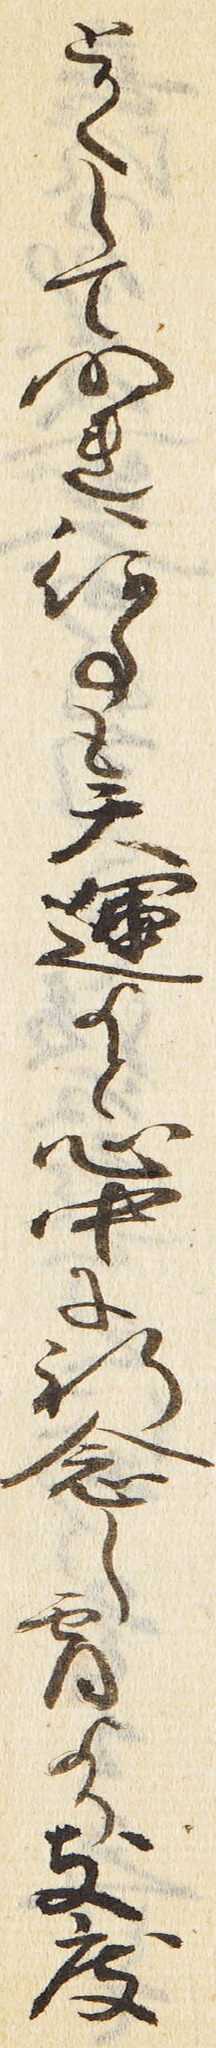とかくして明れは何事も天運よと心中に祈念し宵より支度
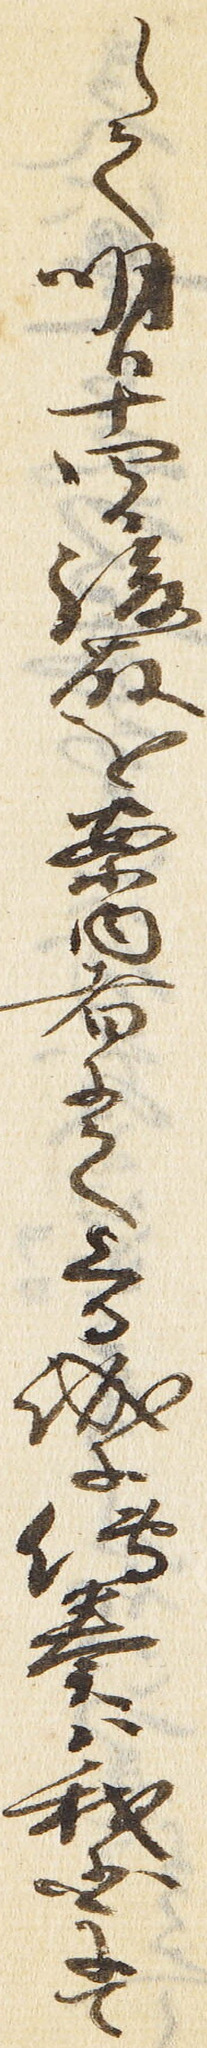して明日十四日後藤を案内者にて上る誠に伝奏は我国にて
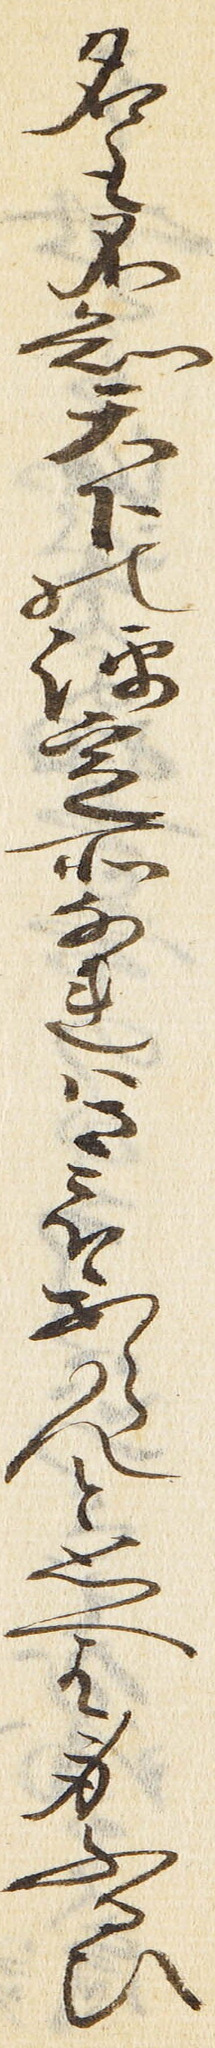名も不知天下の評定所なれはさこそあらんと思へは身ふるひ
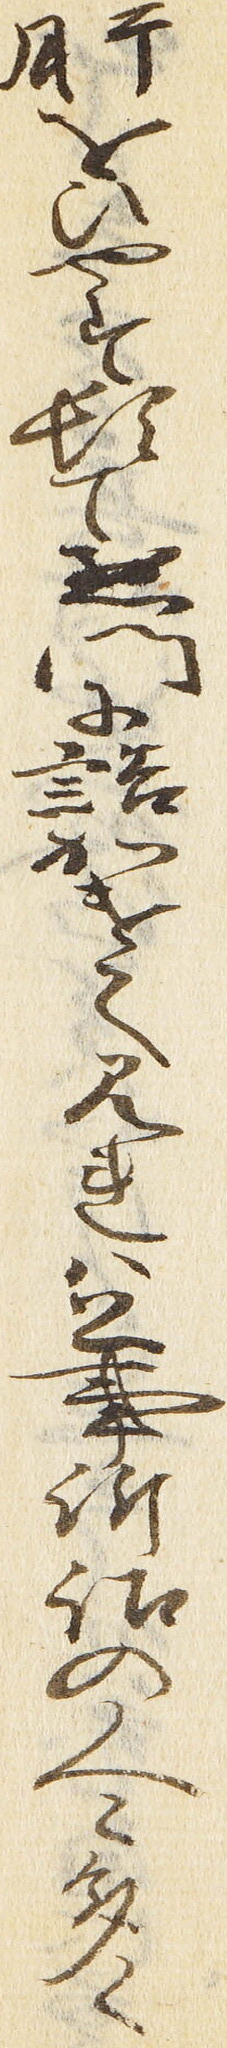肝をひやす頓て惣門に詰かけて見れは公事訴訟の人々多く
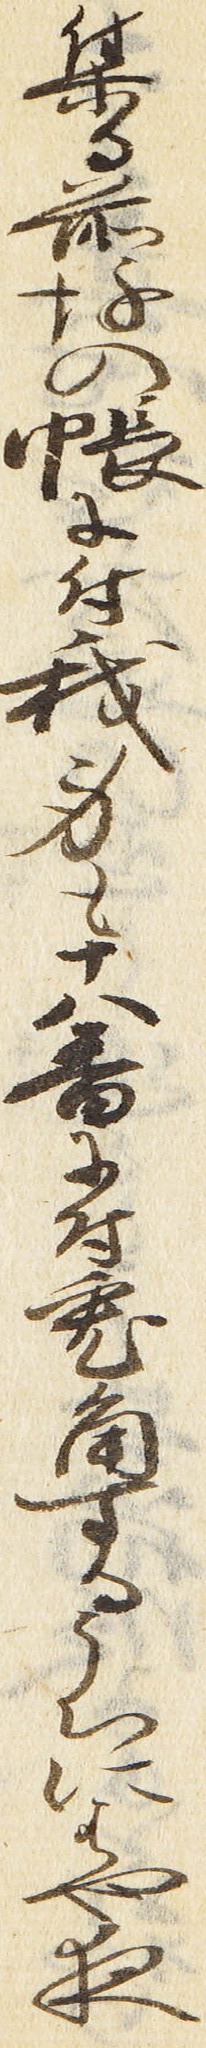集る前後の帳に付我身も十八番に付兎角するうちにはや夜
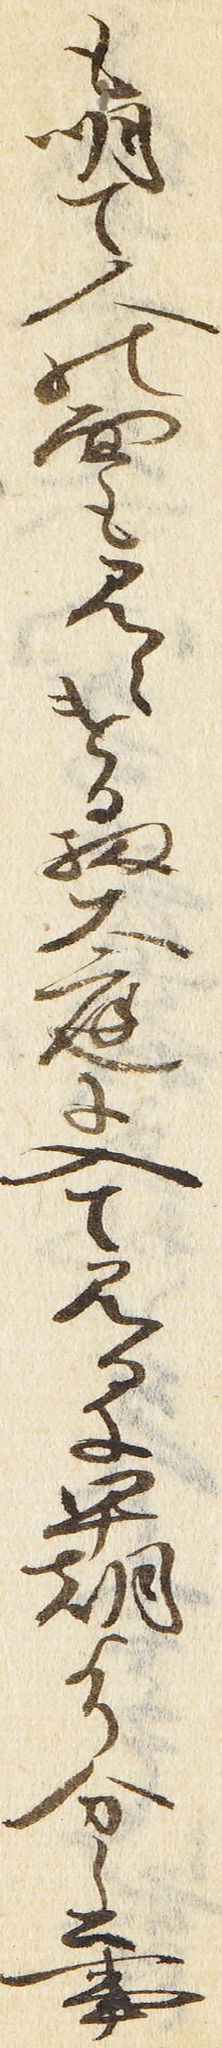も明て人の面も見えける扨大庭に入て見るに早朝より分し公事
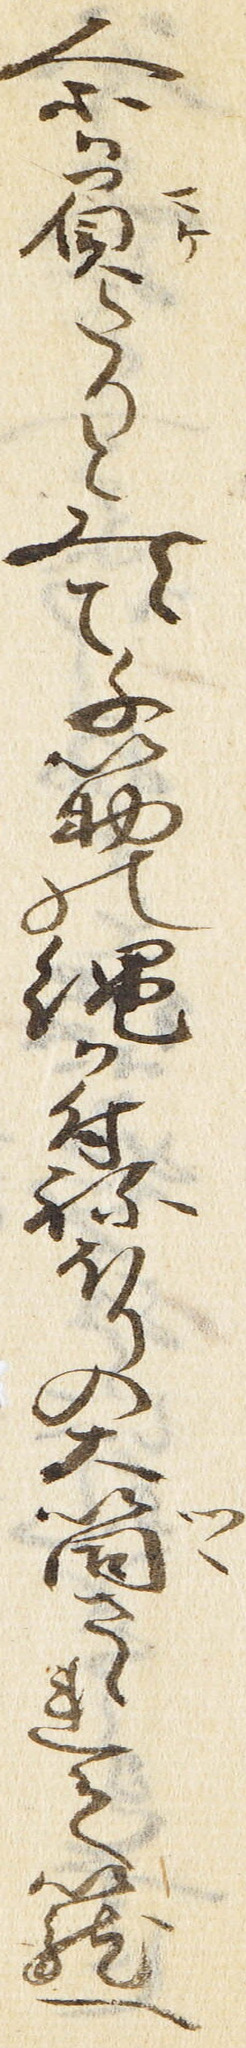人等は負たりとみえて千筋の縄か付ねほりの大筒さゝれて籠へ
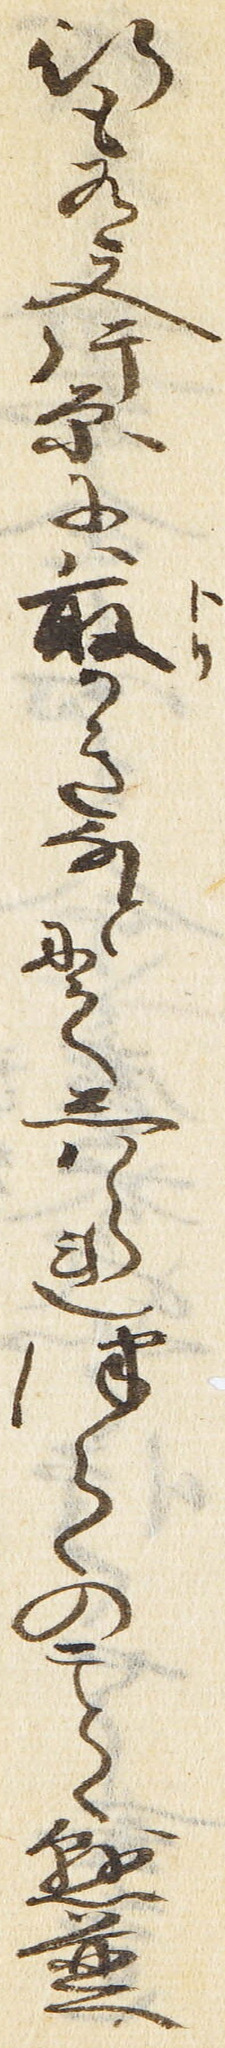行も有又片原には取かきなとにてしはられつらゝのことく懸並へ
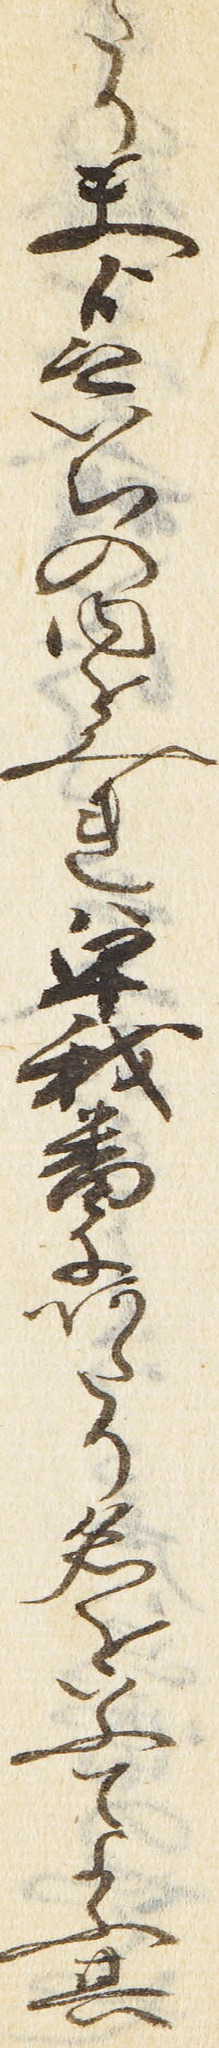たり夫ゟいちの内をみれは早我番にあたり名をいふてよふ其
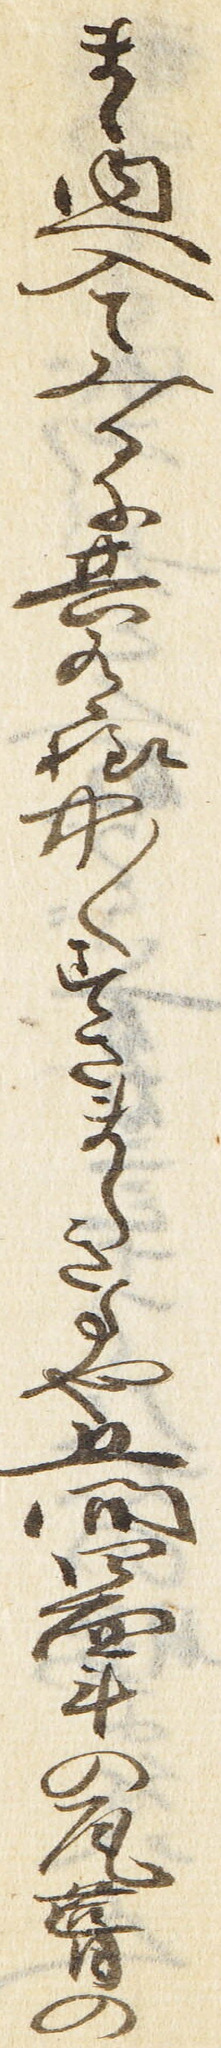まゝ内へ入てみるに其有様中〳〵すさましきよや五間四面斗の瓦葺の
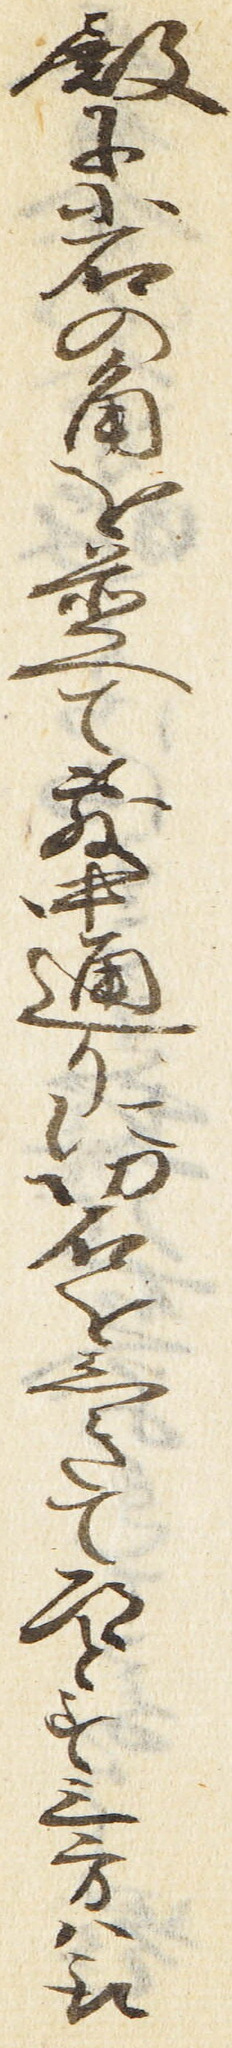殿に小石の角を並へて敷中通りに切石をしきて道とす三方は取
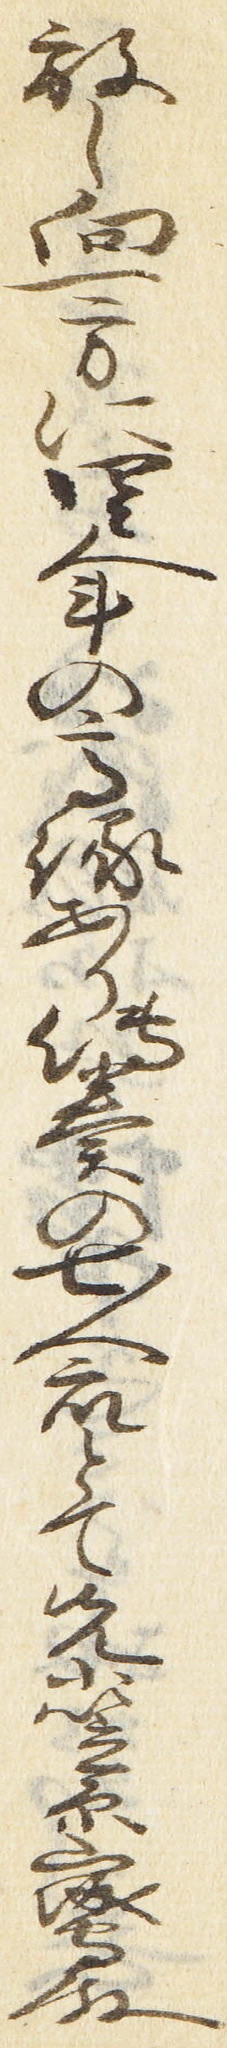放し向一方に四尺斗の高縁あり伝奏の七人衆とて先小笠原山城守殿
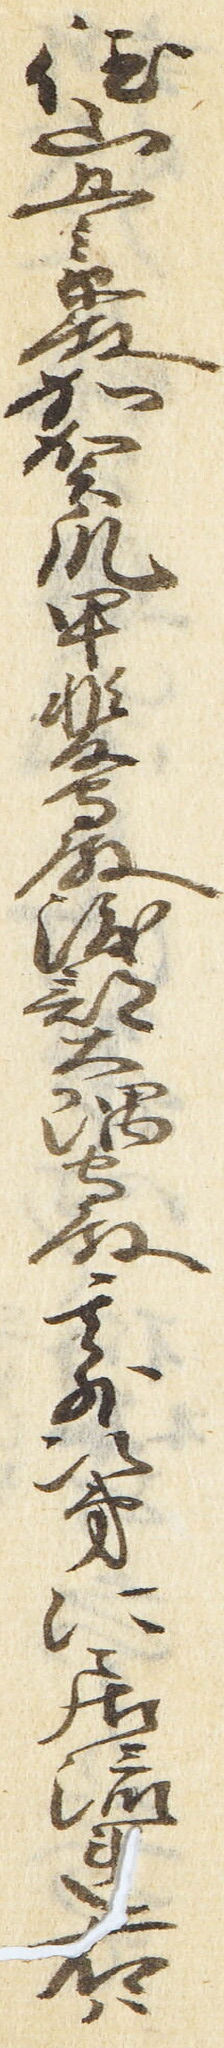徳山五兵衛殿加賀爪甲斐守殿渡部大隅守殿其外次第に居流れ右は

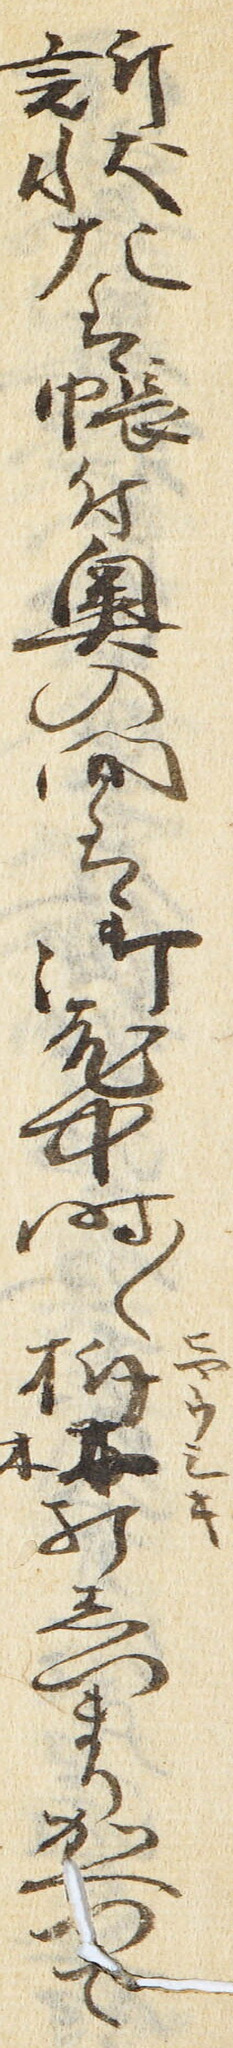訴状左は帳付奥の間は御老中時々杓木打しつまりかへつて
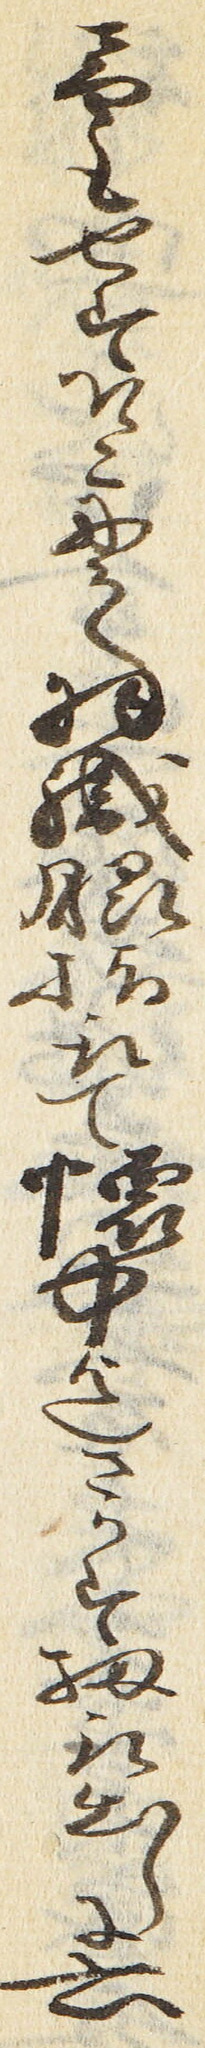音もせすそこにて羽織脇指取て懐中迄さかす扨取出しに六
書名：海陸世話日記
